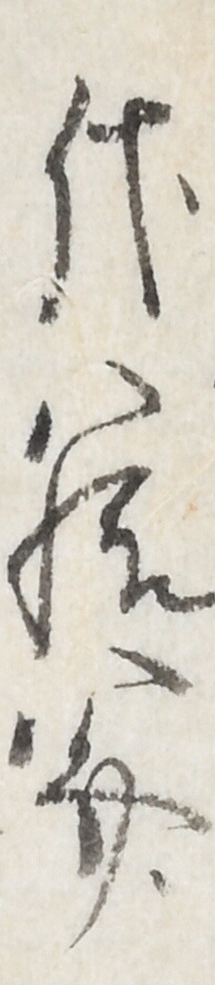代八拾八文
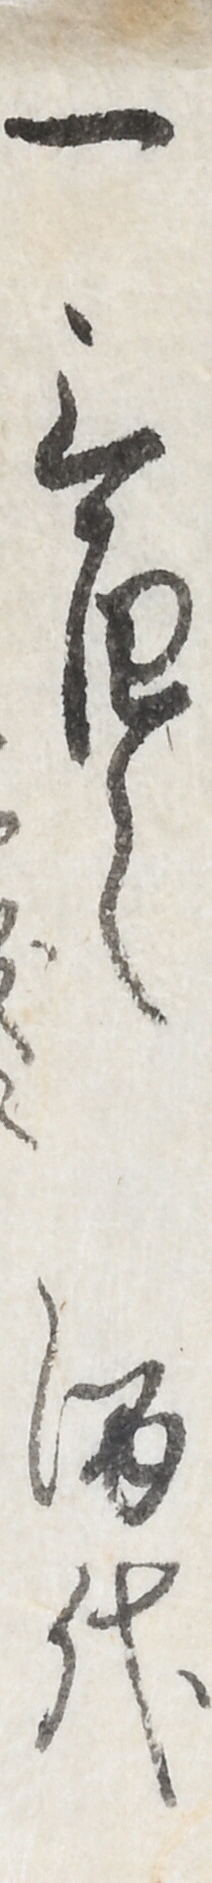一三百文酒代
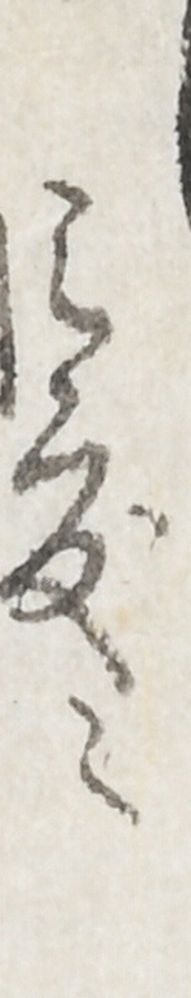六度ニ
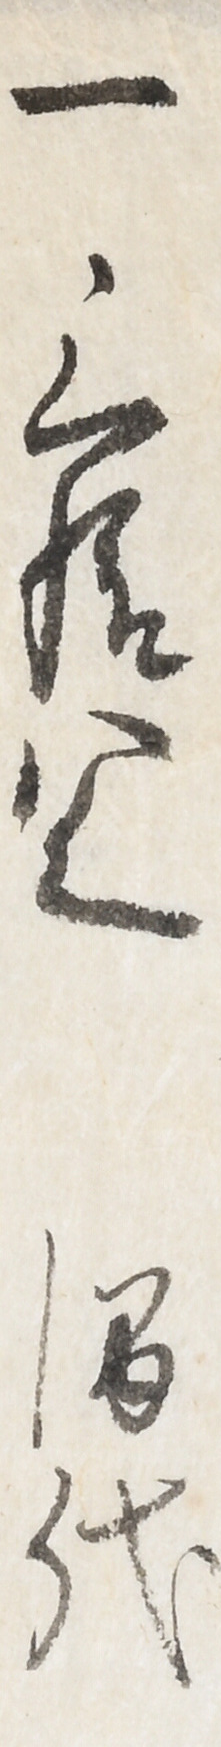一三拾八文酒代
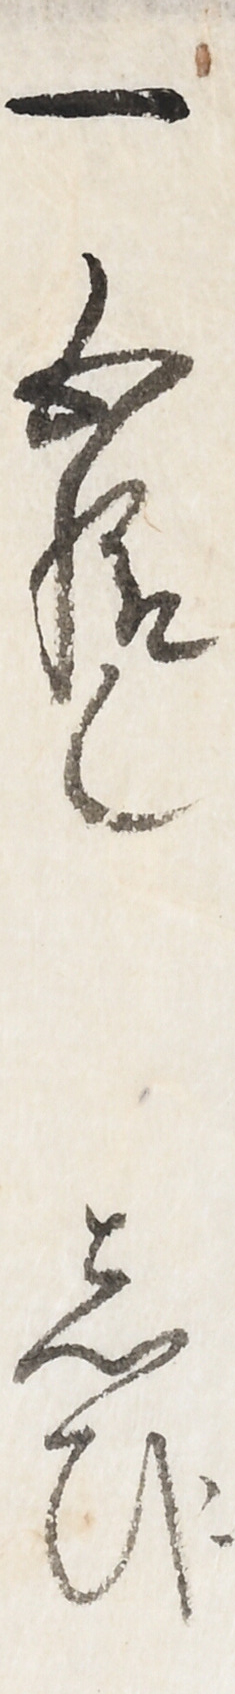一五拾文しび
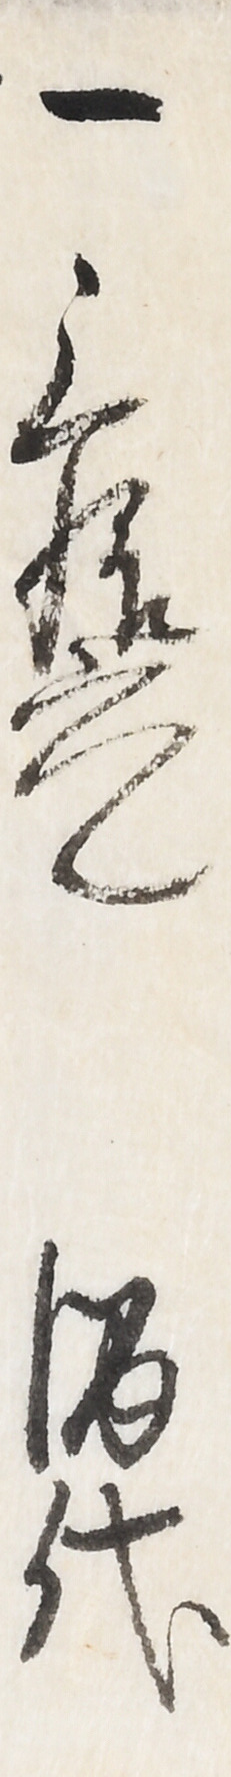一三拾六文酒代

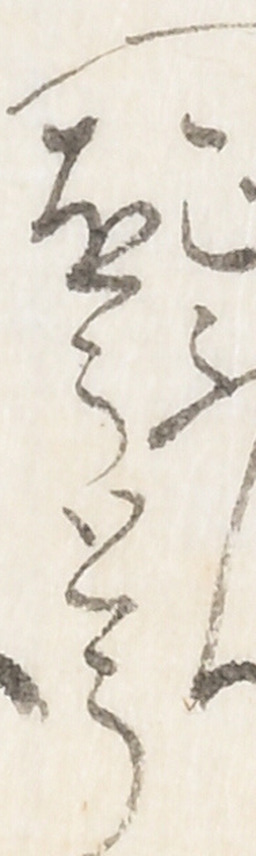をうとう

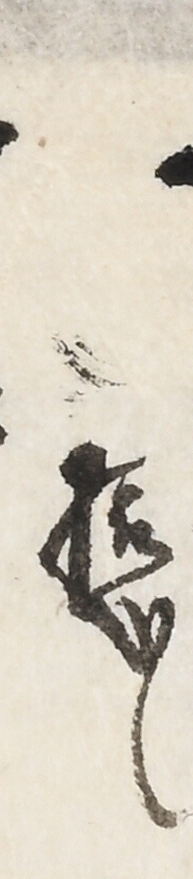拾弐文
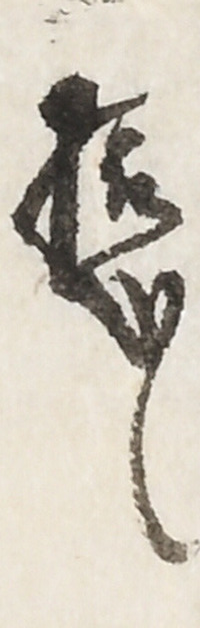拾弐文
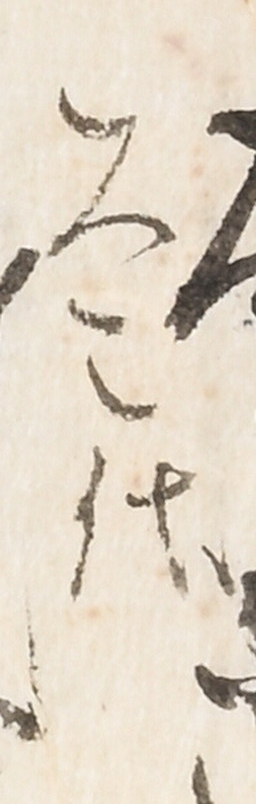大こ代
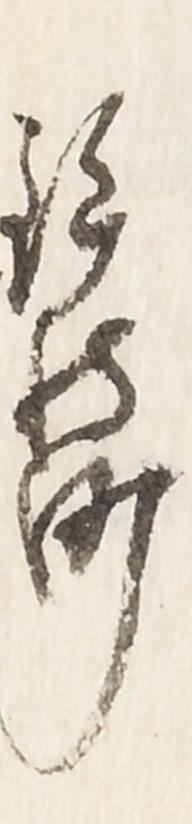鉾持町

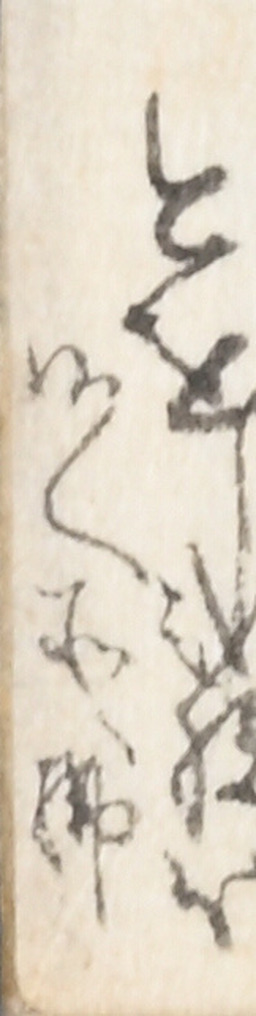同人所へ払

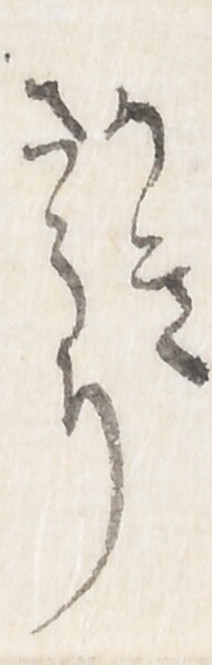さうり

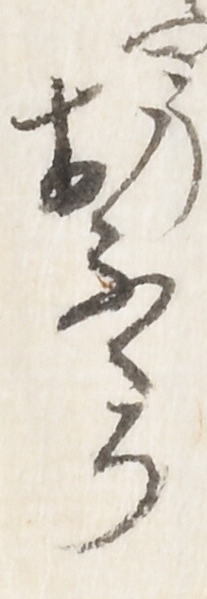おふくろ

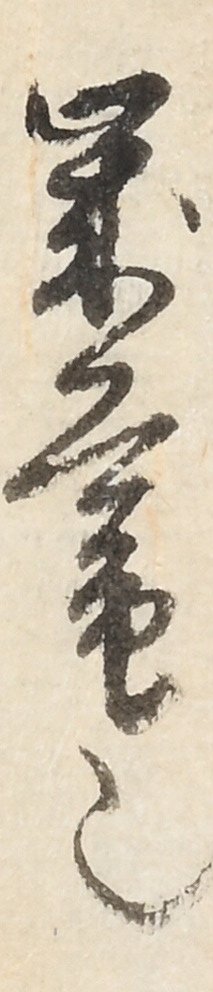歳暮也
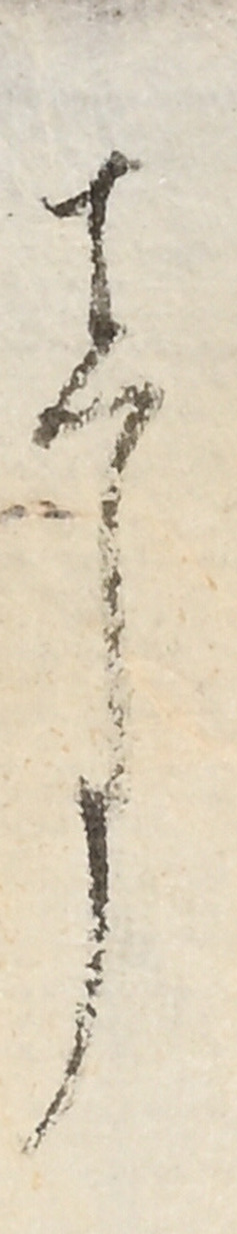十一月
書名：合力覚帳
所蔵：伊那市立高遠町図書館・合同会社AMANE
